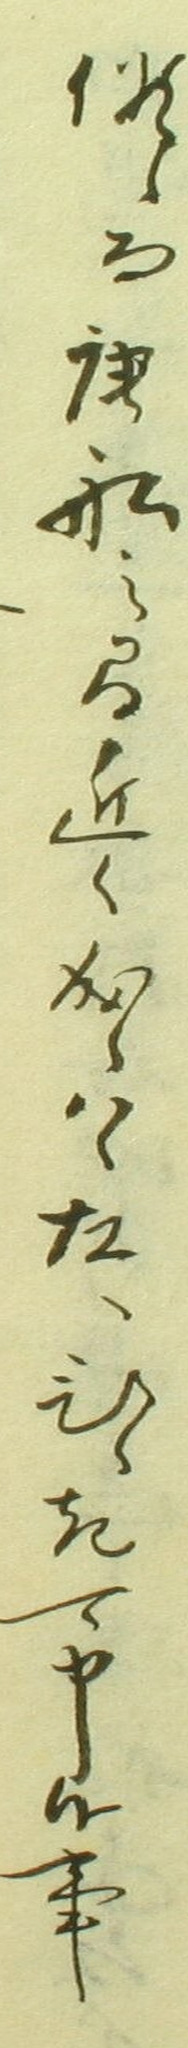候ニ而唐船之間近く成候はゝ左へひき可申候事
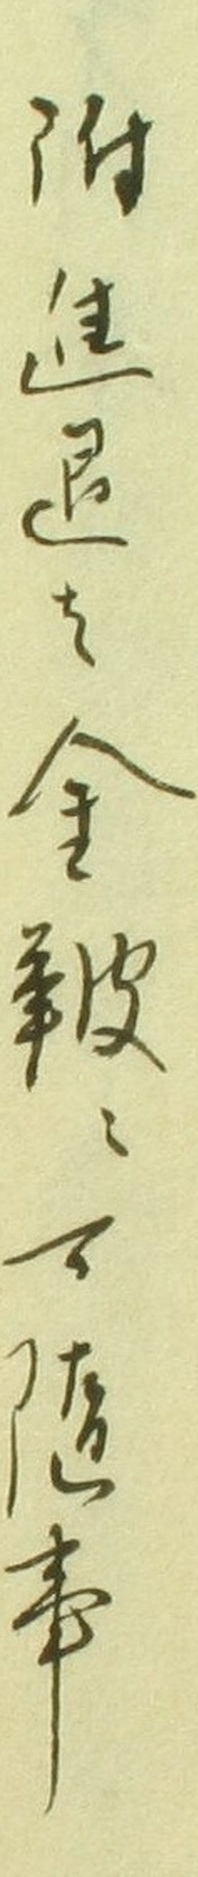附進退は金鼓ニ可随事
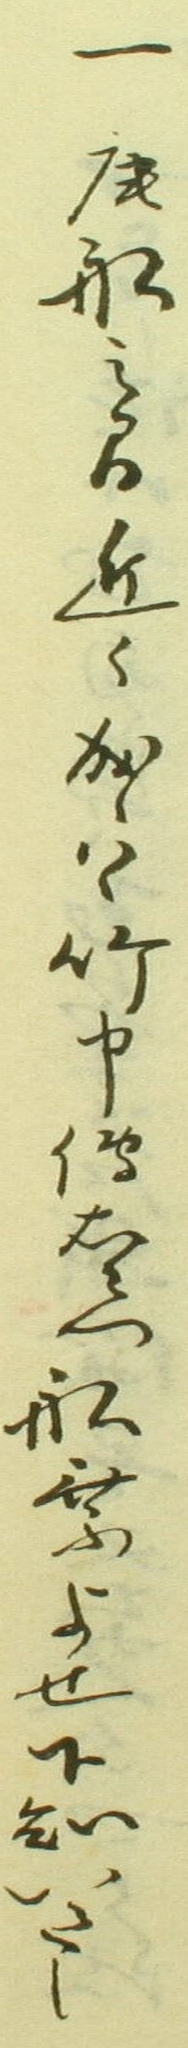一唐船之間近く成候はゝ竹中伝右衛門船乗よせ下知いたし
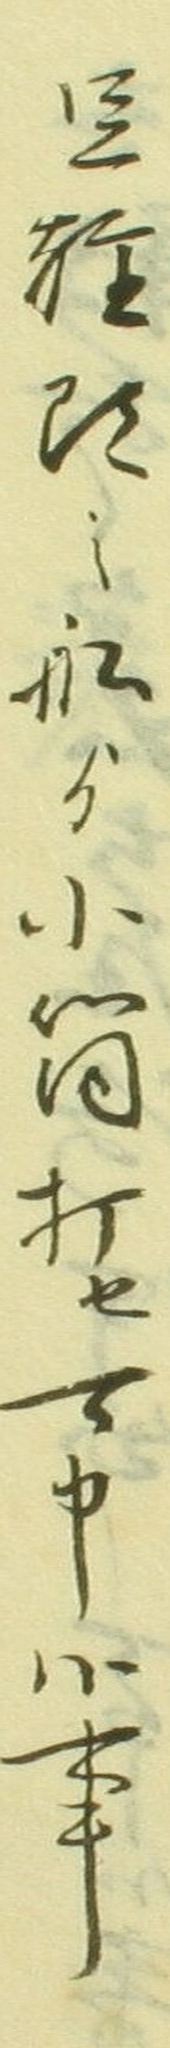足軽頭之船ゟ小筒打せ可申候事
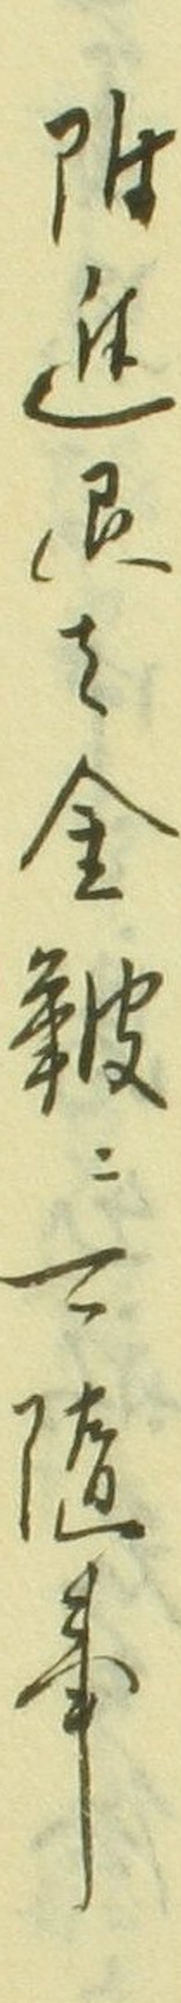附進退は金鼓ニ可随事
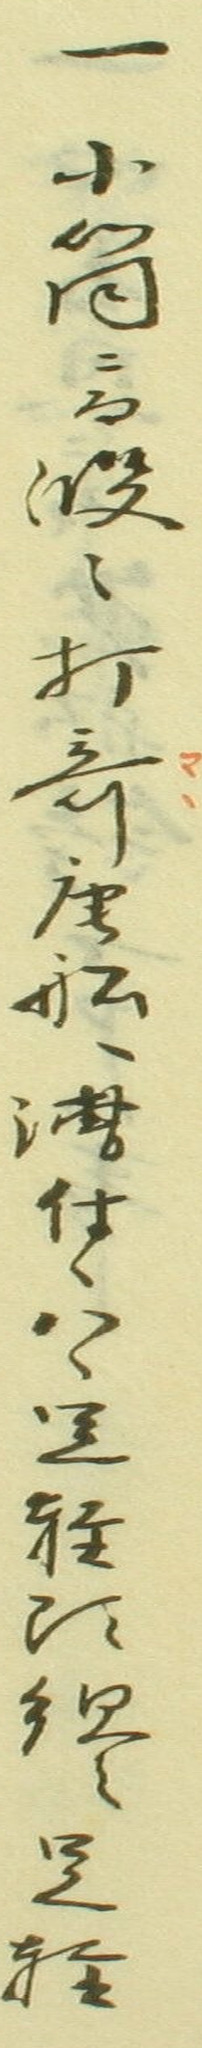一小筒ニ而段々打寄唐船へ漕付候はゝ足軽頭組之足軽
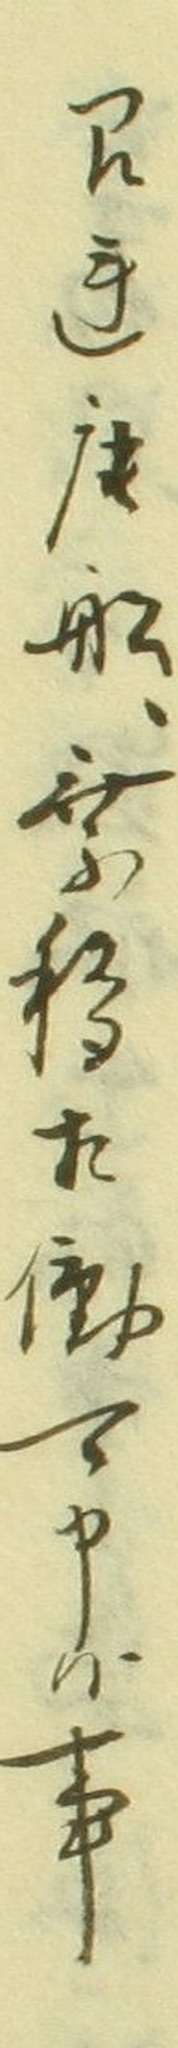召連唐船へ乗移相働可申候事
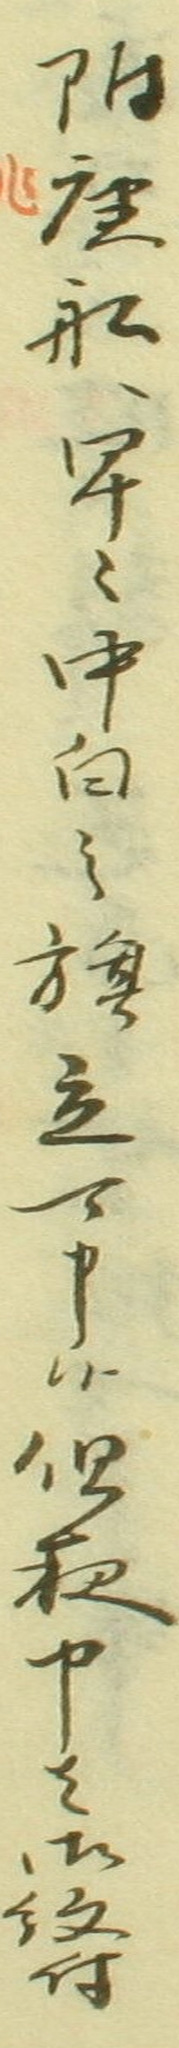附唐船へ早々中白之旗立可申候但夜中は御紋付
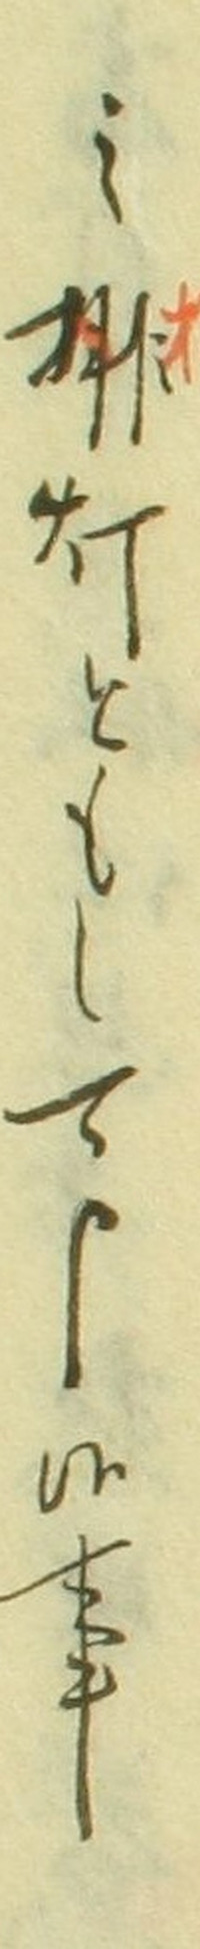之挑灯ともし可申候事
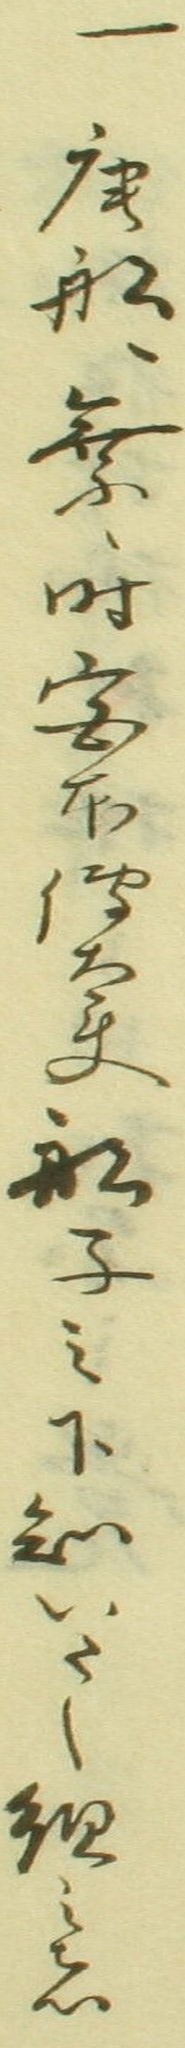一唐船へ乗候時宮本傳太夫船子之下知いたし組之者
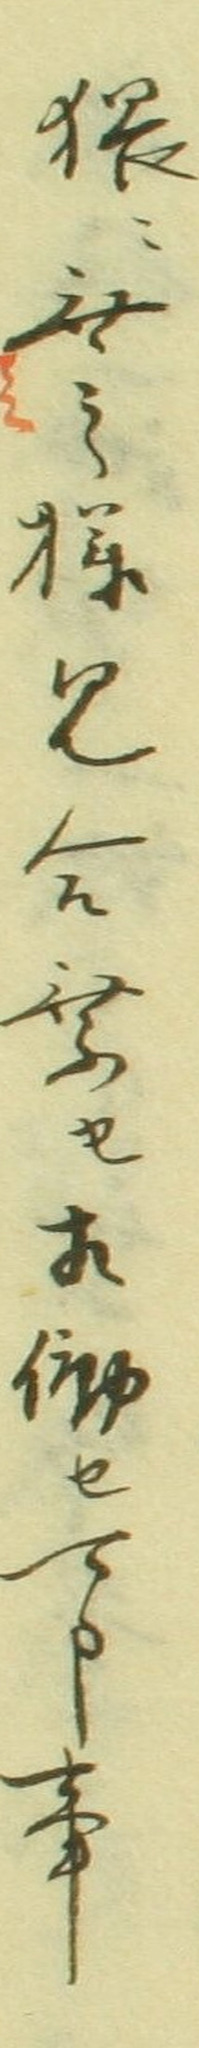猥ニ無之様見合乗せ相働せ可申事
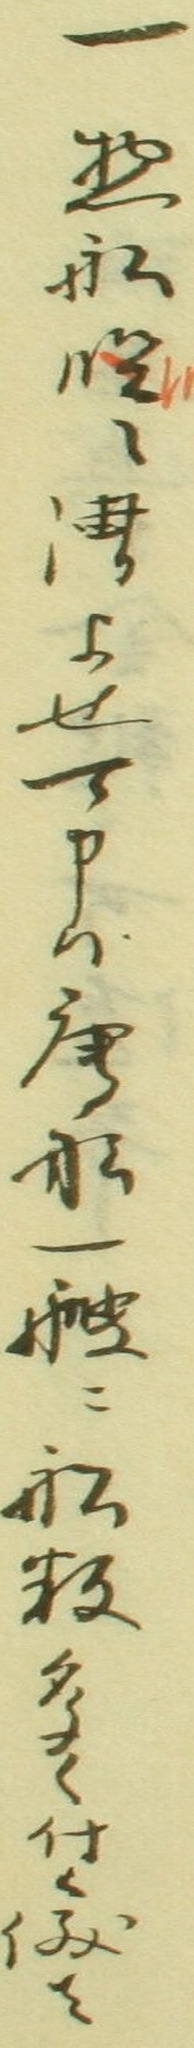一惣船段々漕よせ可申候唐船一艘ニ船数多く付く儀は
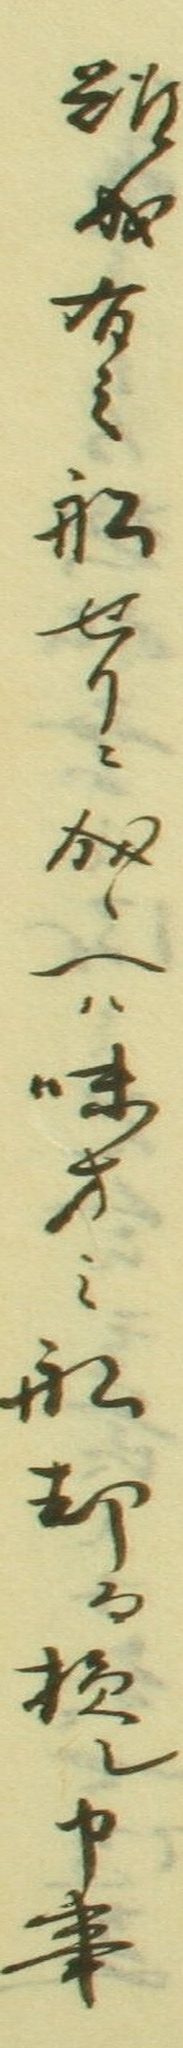難成有之船せりに成候へは味方之船却而損し申事

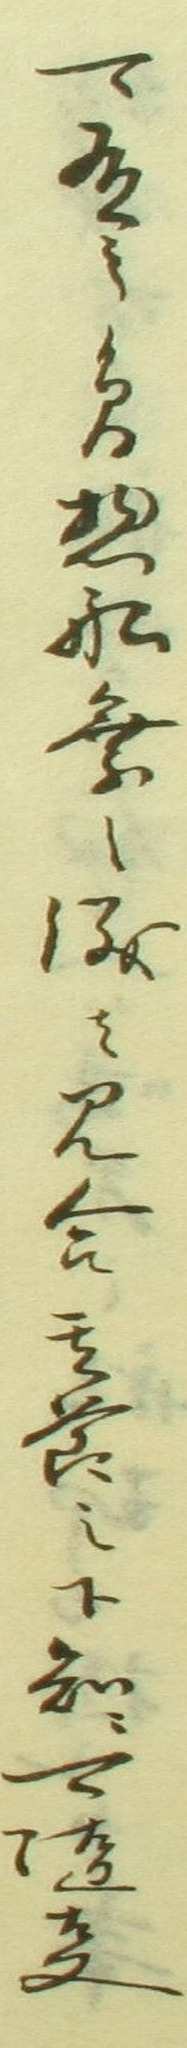可有之候間惣船乗之儀は見合其節之下知ニ可随叓
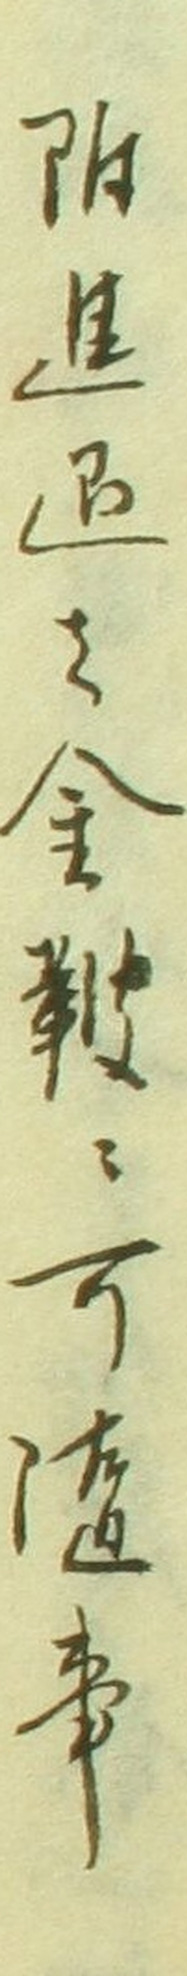附進退は金鼓ニ可随事
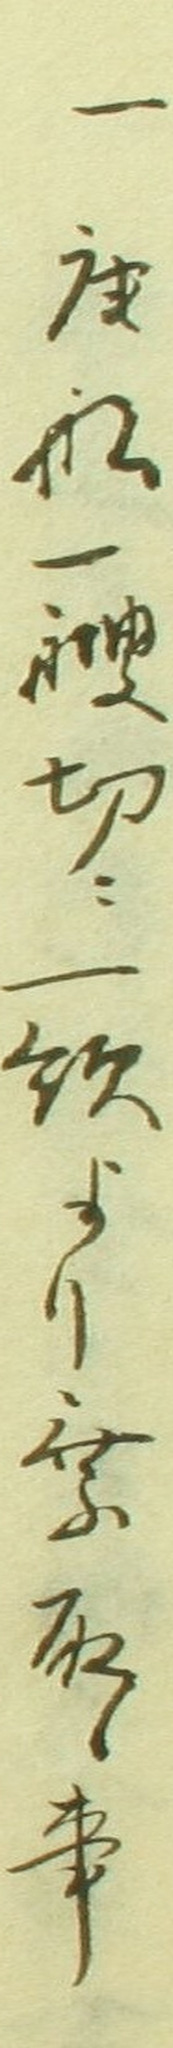一唐船一艘切ニ一より乗取候事
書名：唐船漂流記 二
